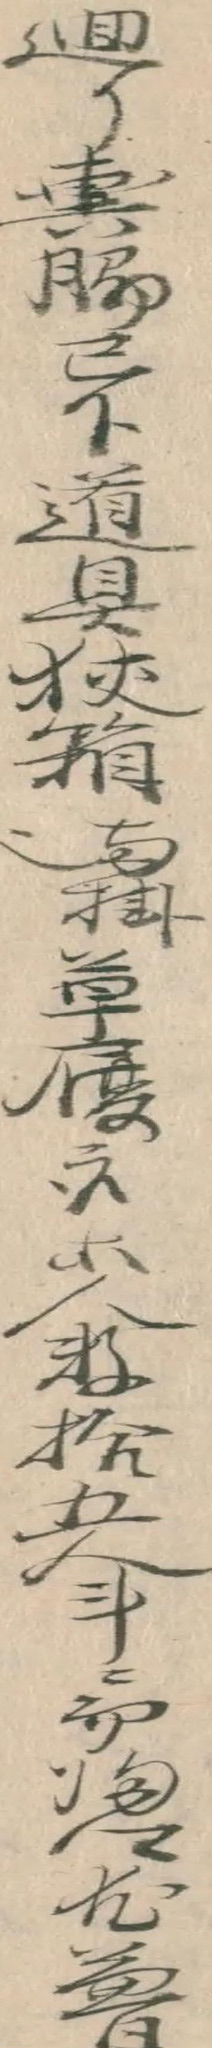廻了輿脚已下道具挟箱両掛也草履取等人数拾五人斗ニ而帰郷尤兼日
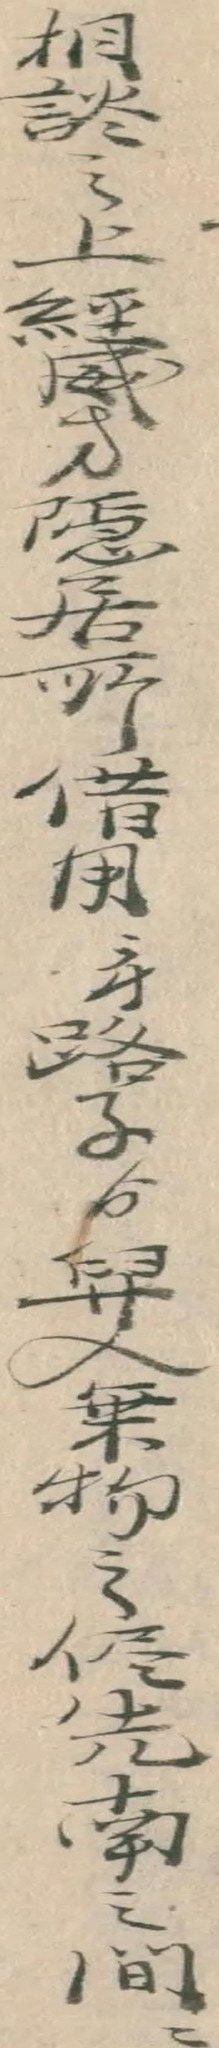相談之上経威方隠居所借用ニ付路子ゟ舁入乗物之侭先南之間ニ
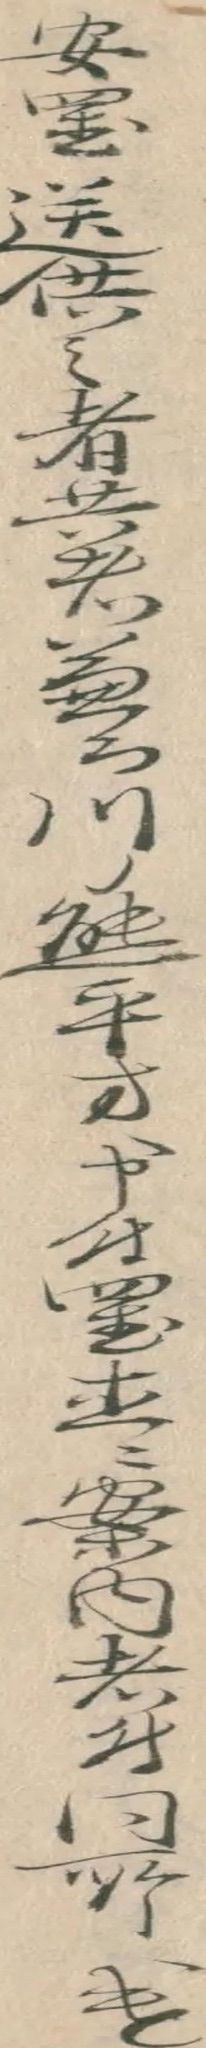安置送供之者共者兼而川熊平方へ申付置直に案内者付同所へ遣
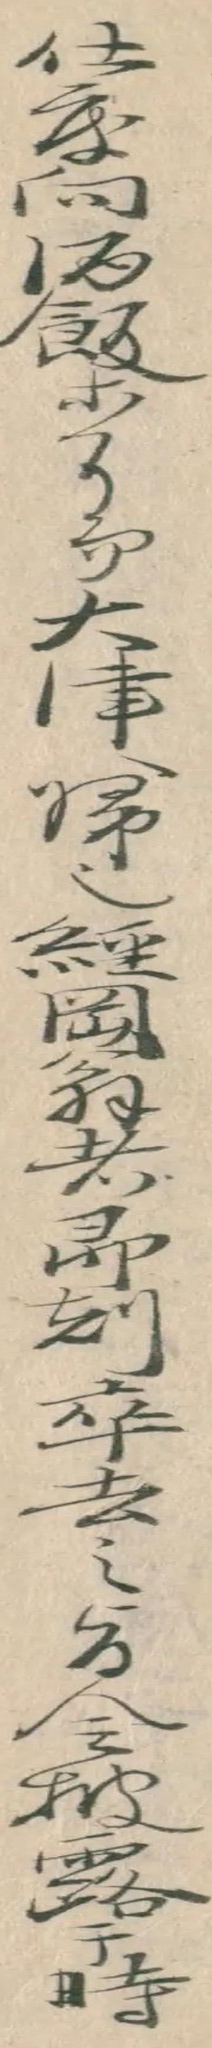仕度向酒飯等了而大津へ帰也経岡翁者即刻卒去之旨令披露于時
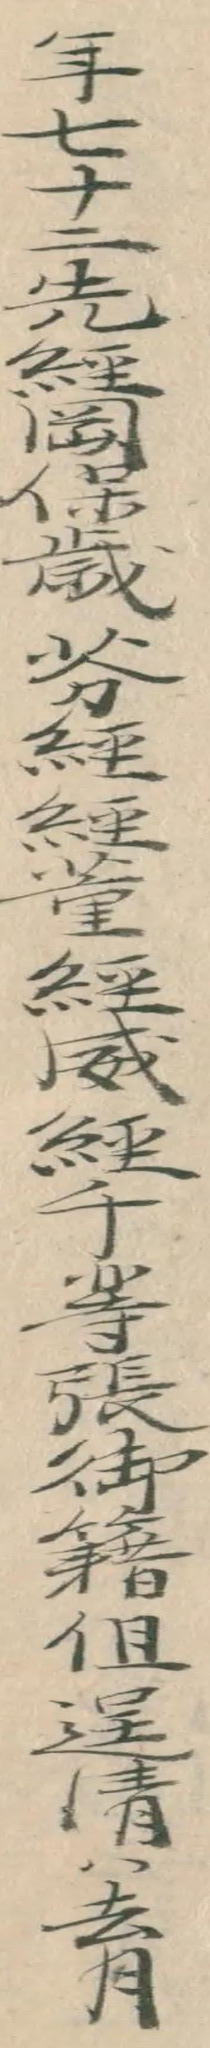年七十二先経岡保歳芬経経董経威経千等張御籍但逞清ハ去月
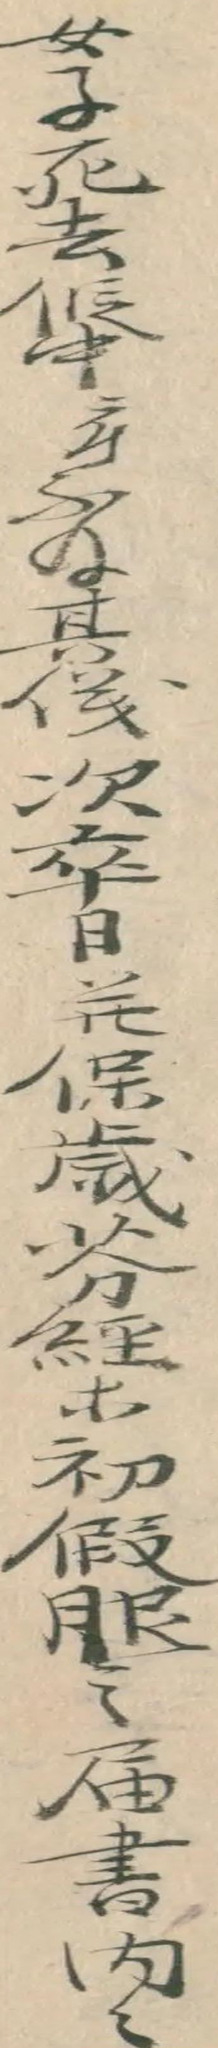女子死去仮中ニ付不及其儀次卒日并保歳芬経等初仮服之届書内々
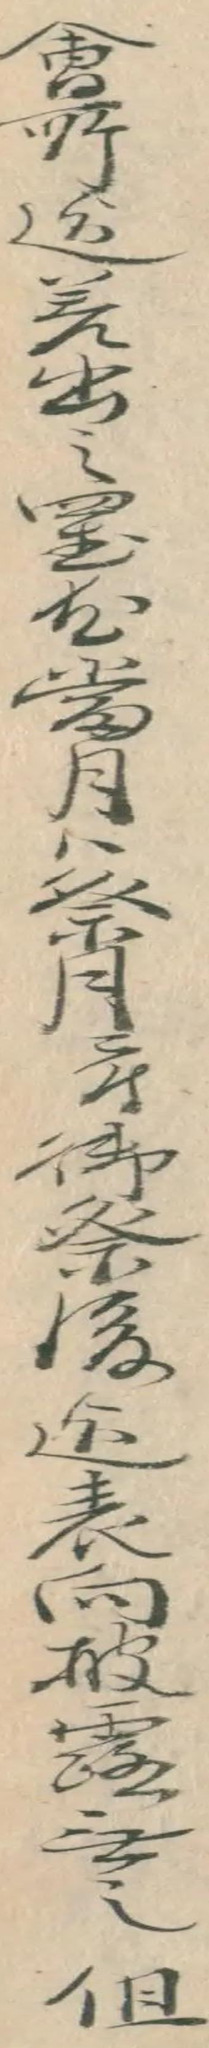會所迄差出之置尤當月ハ祭月ニ付御祭後迄表向披露無之但

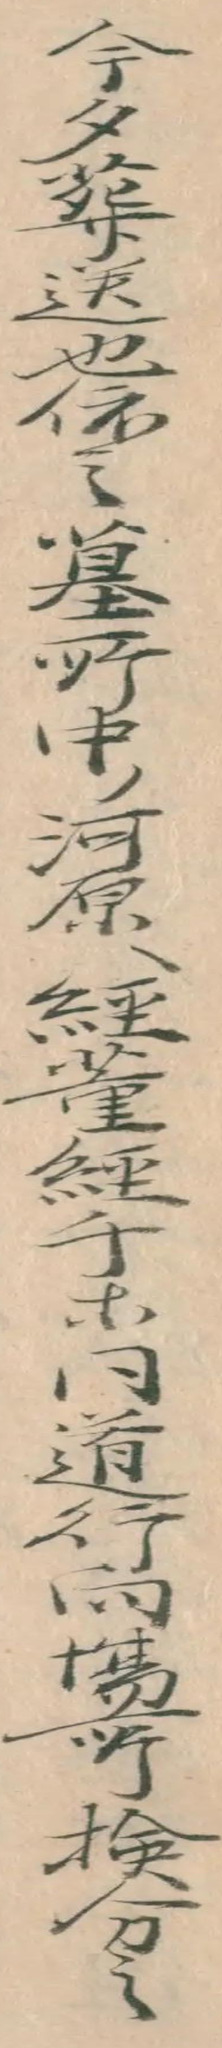今夕葬送也依之墓所中ノ河原へ経董経于等同道行向場所検分之
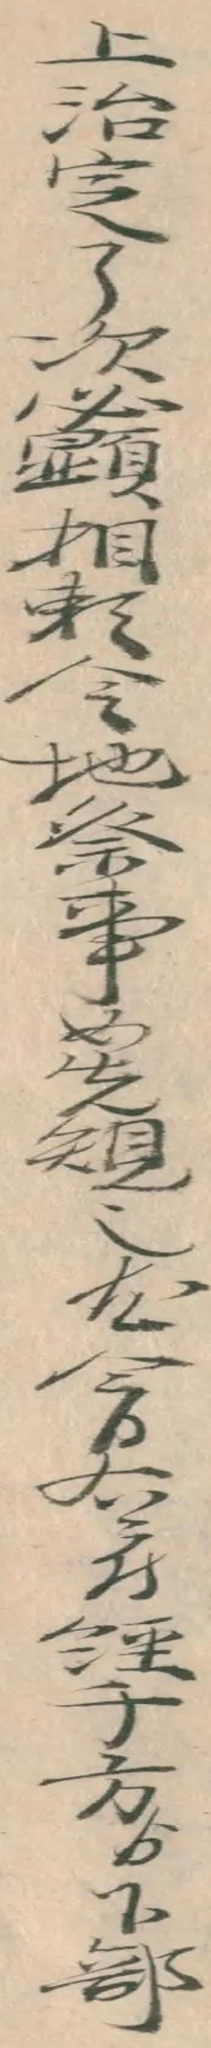上治定了次必顕相頼令地祭事如先規也尤今日右ニ付経千方ゟ下部
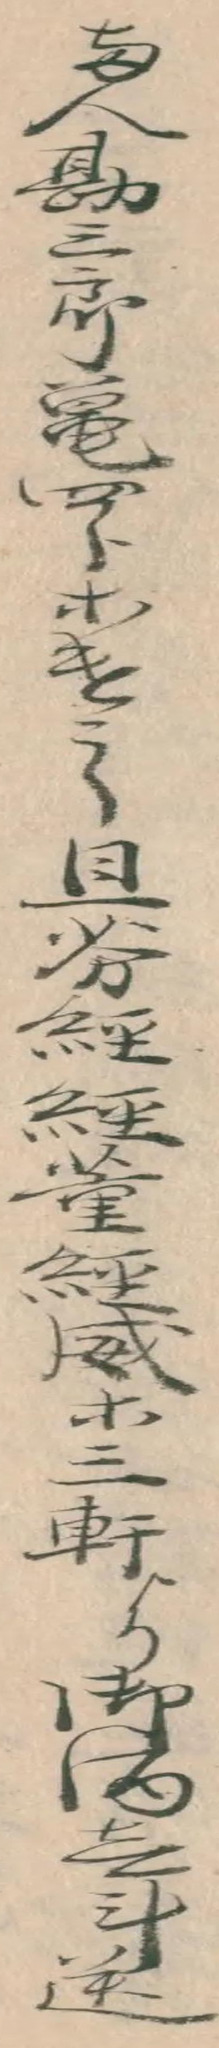両人勘三郎亀四郎等遣之且芩経経董経威等三軒より御酒壱斗送
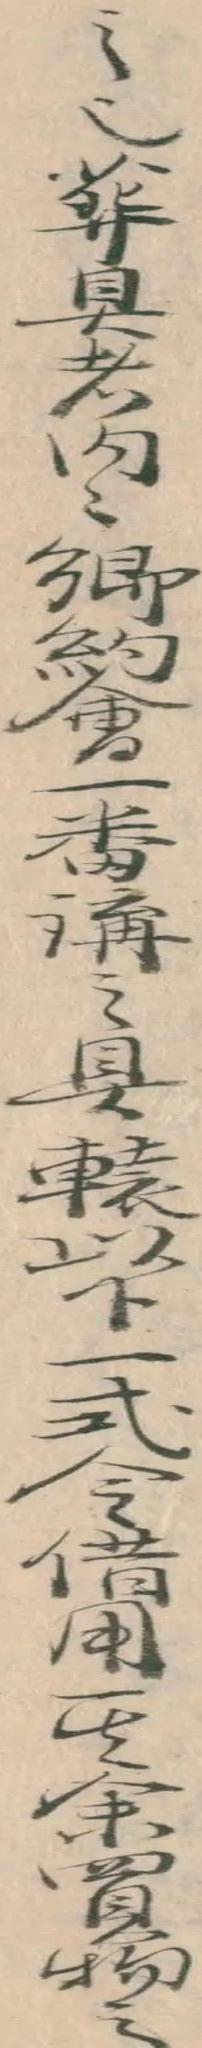之也葬具者内々郷約會一番講之轅具以下一式令借用其余買物之
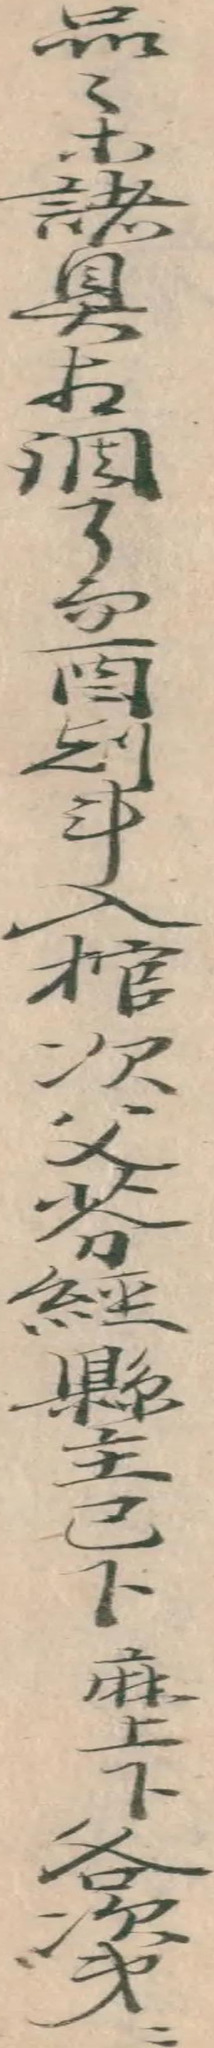品々等諸具相調了而酉刻斗入棺次父芩経縣主已下麻上下各次第ニ
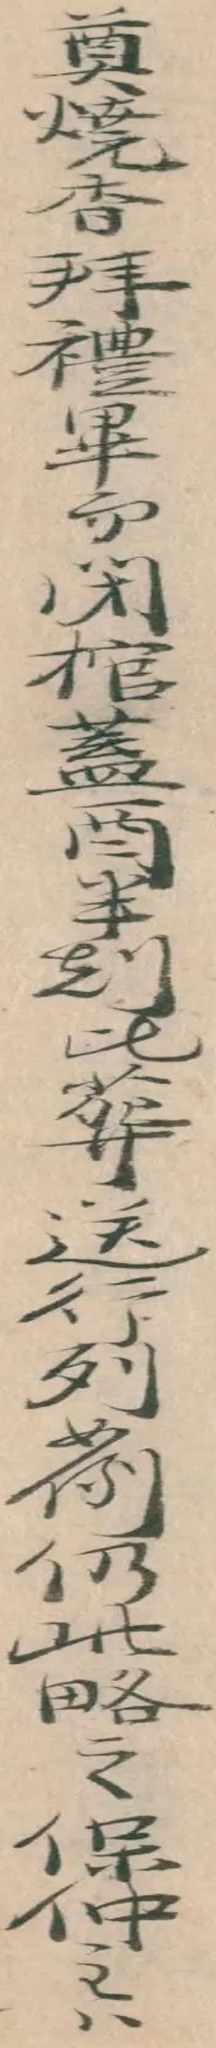奠焼香拝禮畢而閉棺蓋酉半刻比葬送行列如例仍此略之保仲主ハ
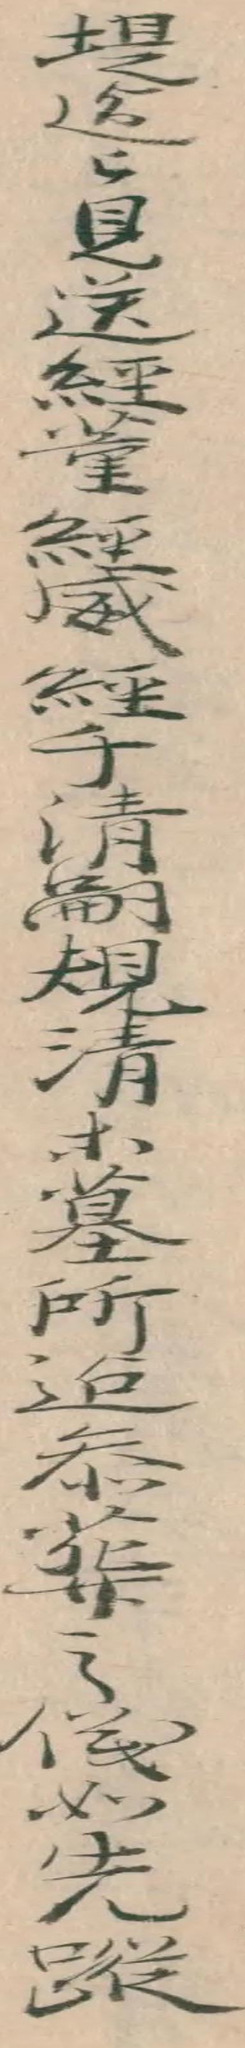堤迄被見送経董経威経于清嗣規清等墓所迄参葬之儀如先蹤
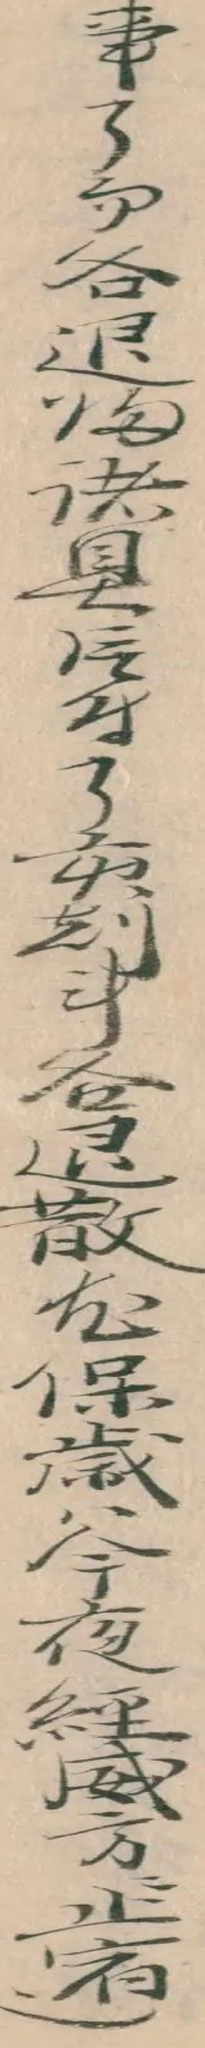事了而各退帰諸具片付了寅刻斗各退散尤保歳ハ今夜経威方ニ止宿也
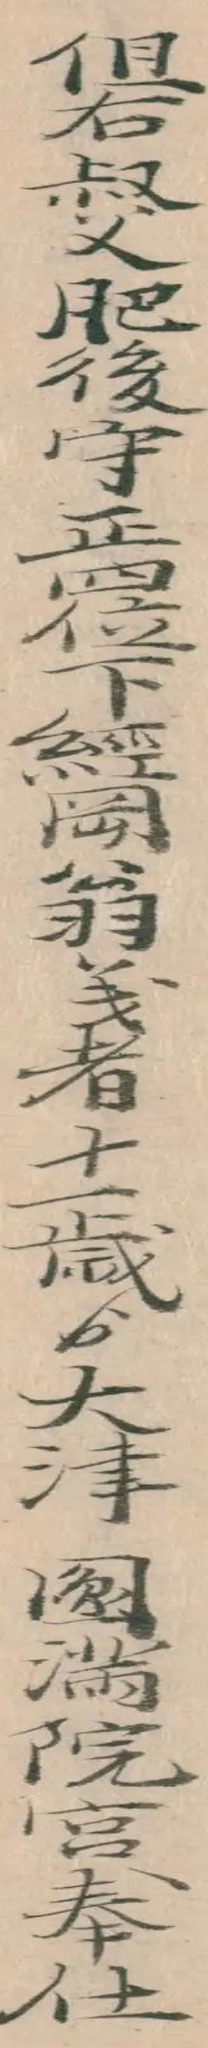但右叔父肥後守正四位下経岡翁義者十一歳ゟ大津圓満院宮ヘ奉仕
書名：賀茂社記録. 第65冊
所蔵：国立国会図書館 National Diet Library, JAPAN
